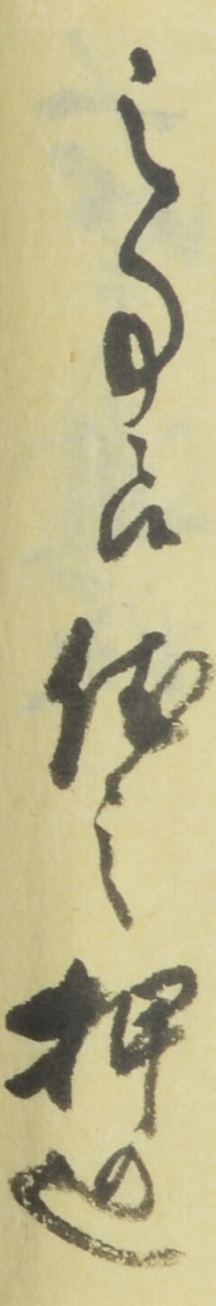之事ニ候依之押込
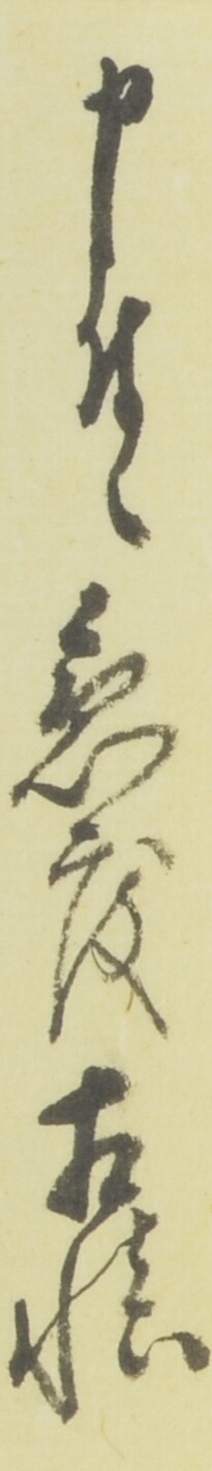申付候急度相慎
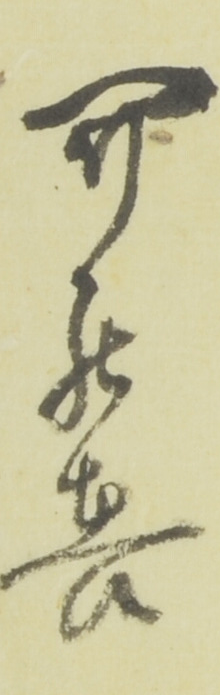可罷在候
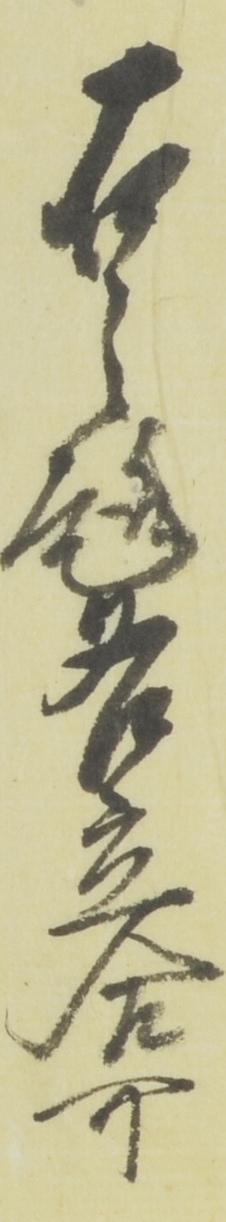右之趣各立合可
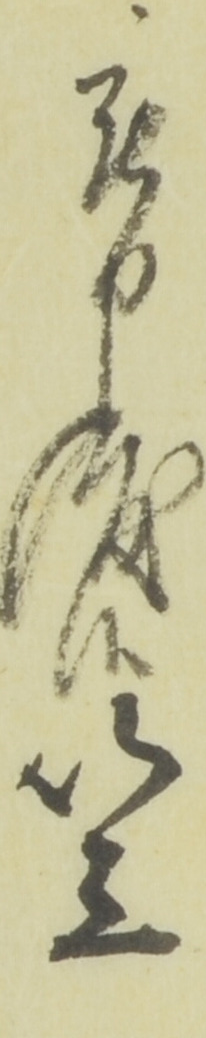被申渡候以上
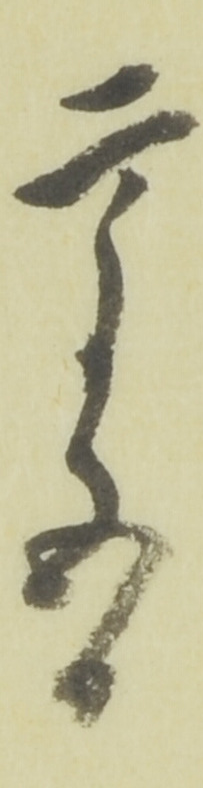二月五日
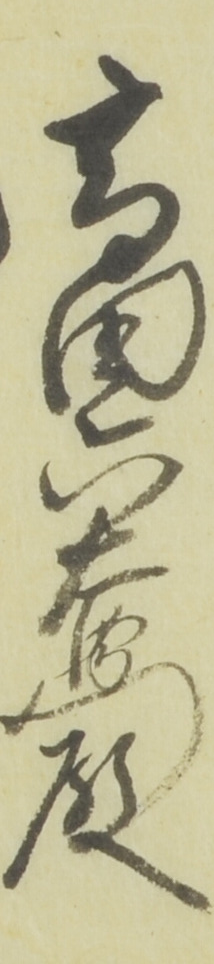高田六右衛門殿
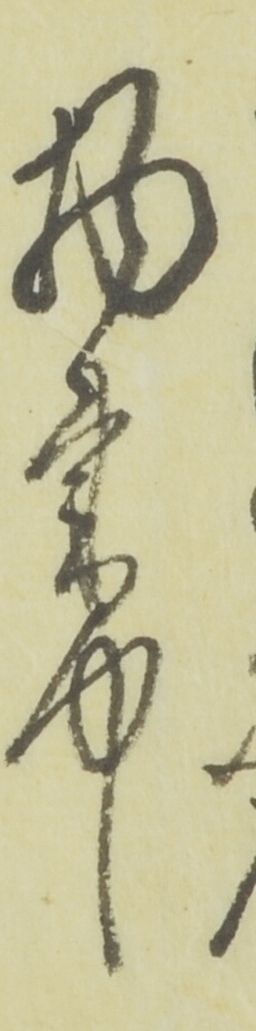物書中
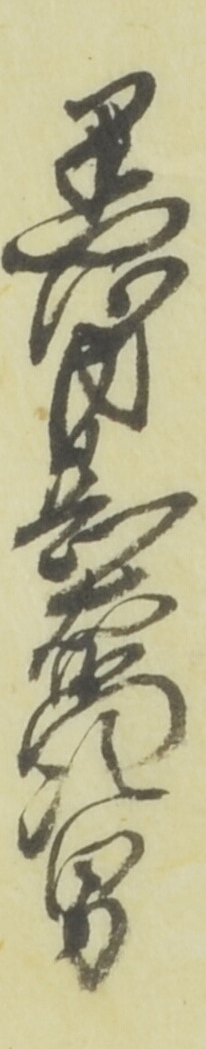黒河内甚右衛門次男
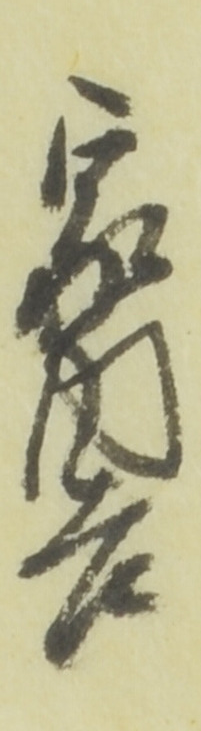家内吉
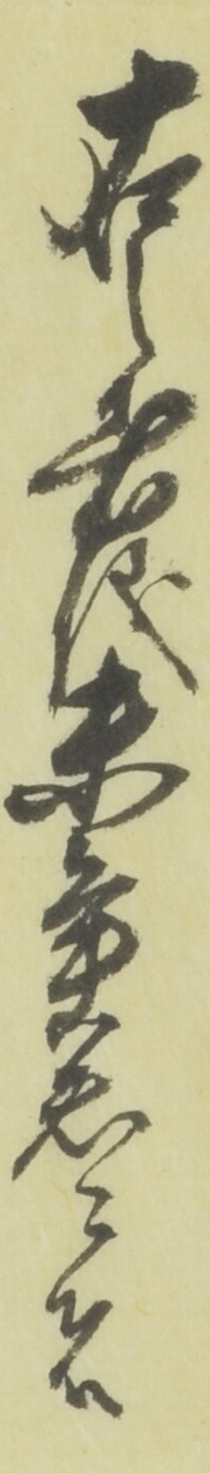右之者儀未年若ニは
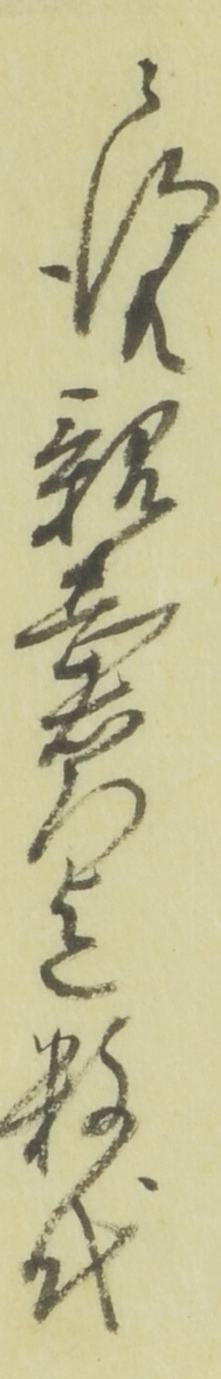候得共親甚右衛門迄数代
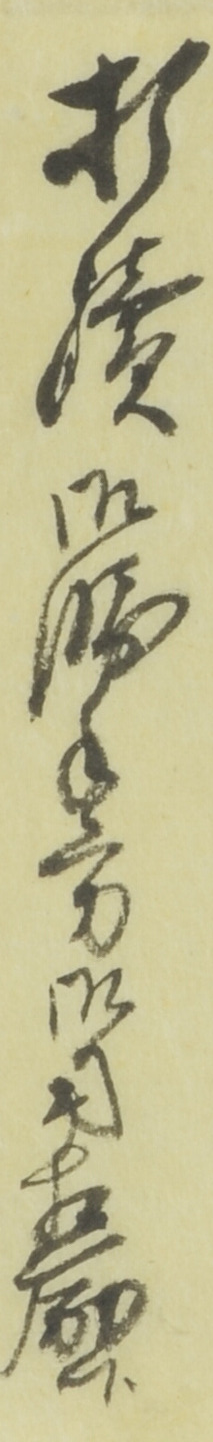打続御勝手方御用相励候
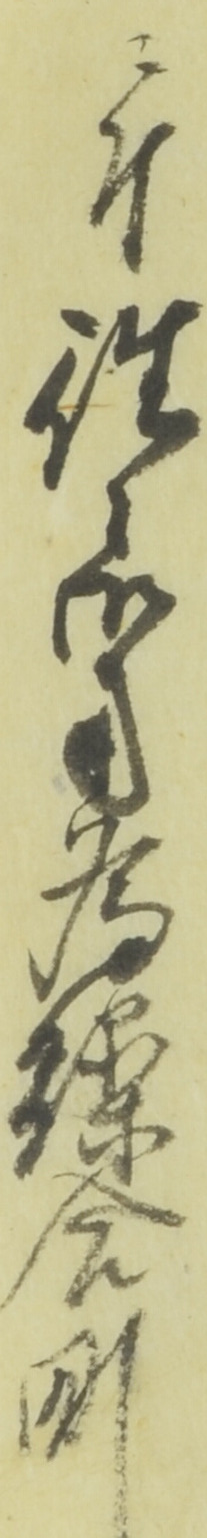ニ付往々御用為繰合町

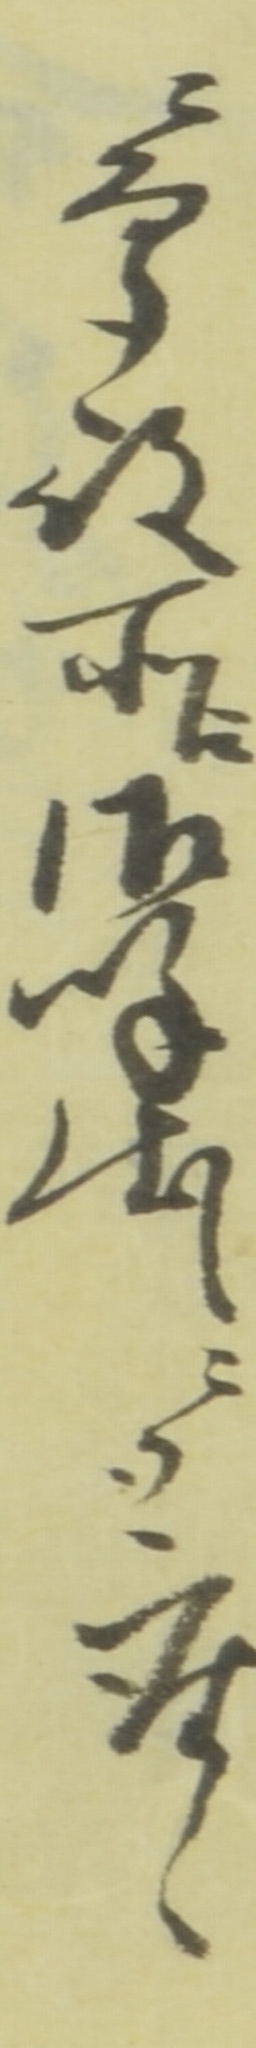ニ而御改所江御呼出しニ而御座候
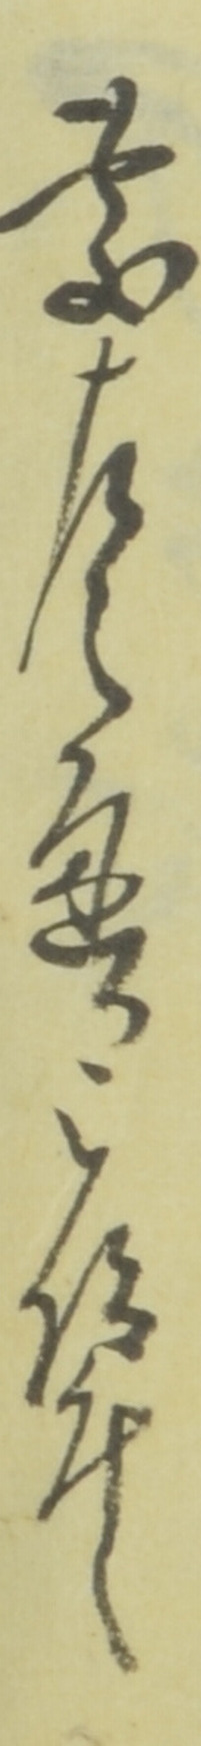処左之通り被仰御座候
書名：御触書御書附控
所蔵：伊那市立高遠町図書館・合同会社AMANE
